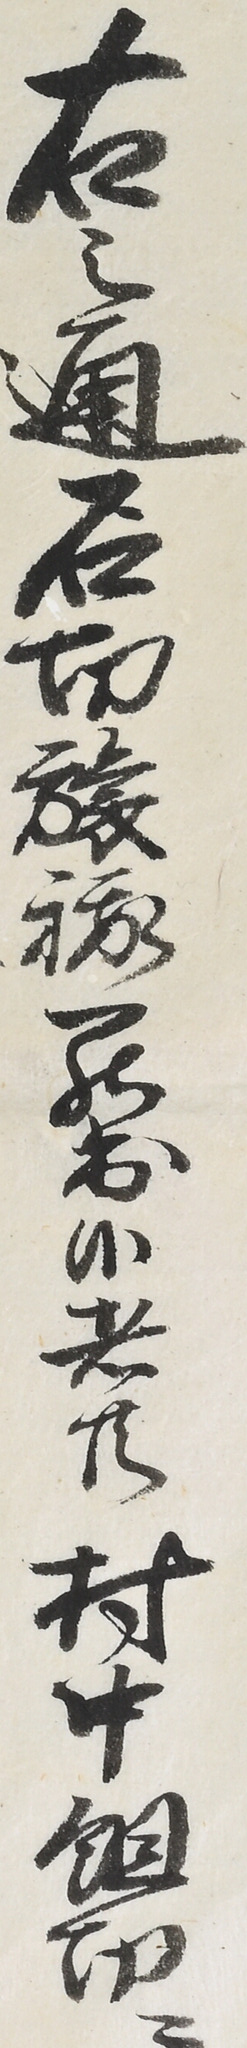右之通石切旅稼罷出候者共村中組切ニ
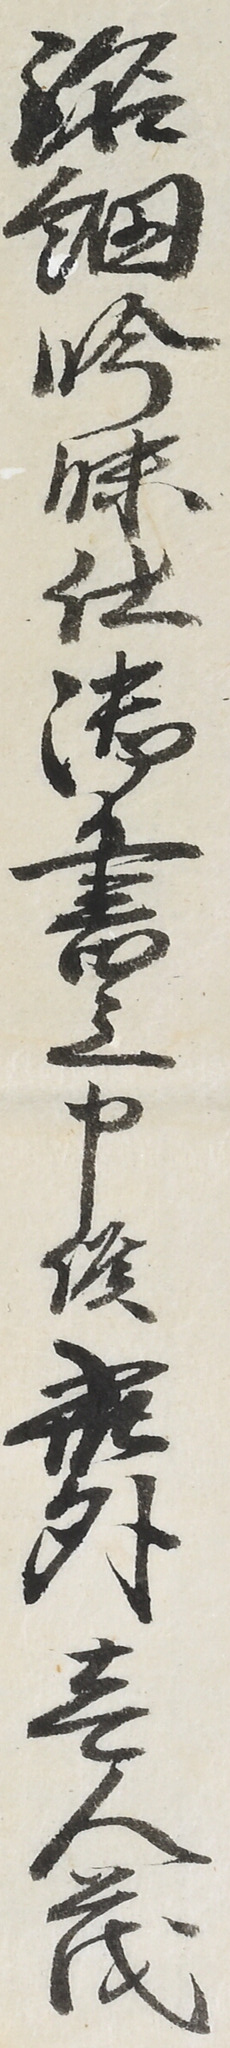銘細吟味仕御書上申候此外壱人茂
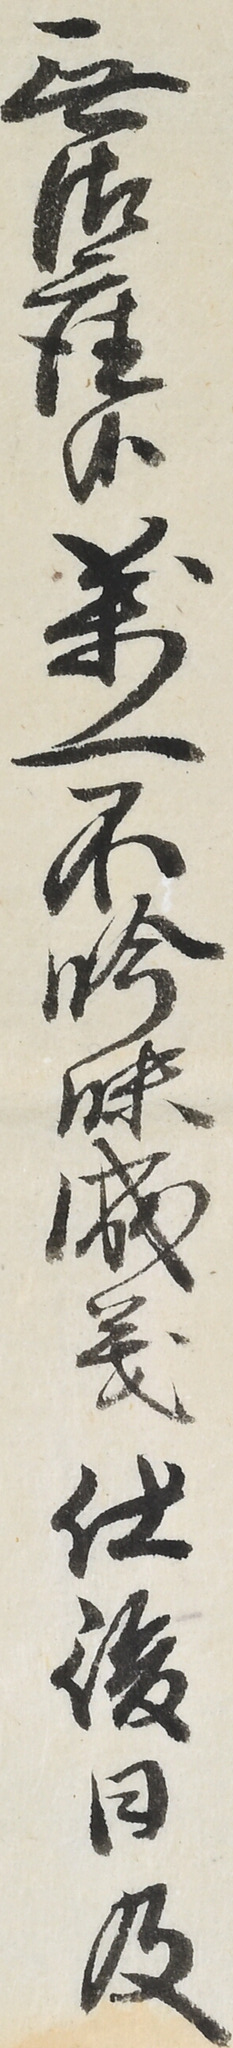無御座候万一不吟味成義仕後日及
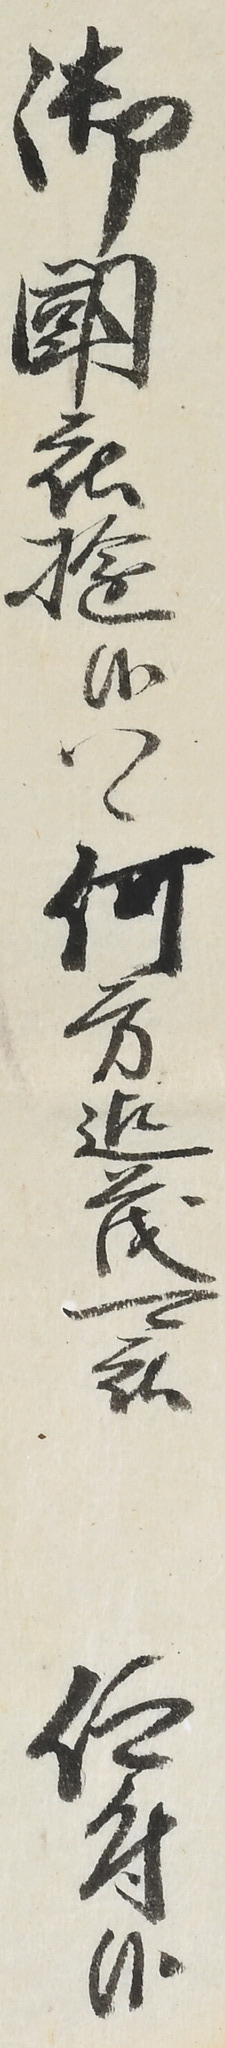御国被遊候ハヽ何方迄茂可被仰付候
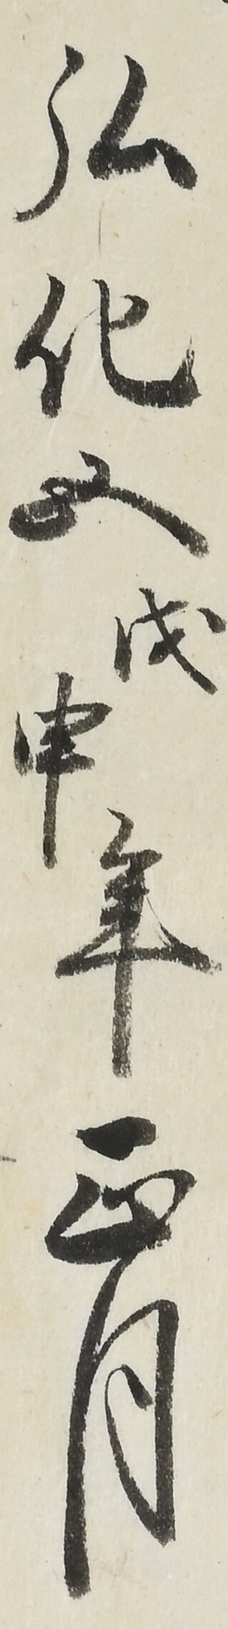弘化五戊申年正月

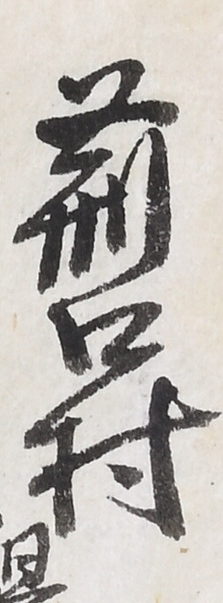荊口村
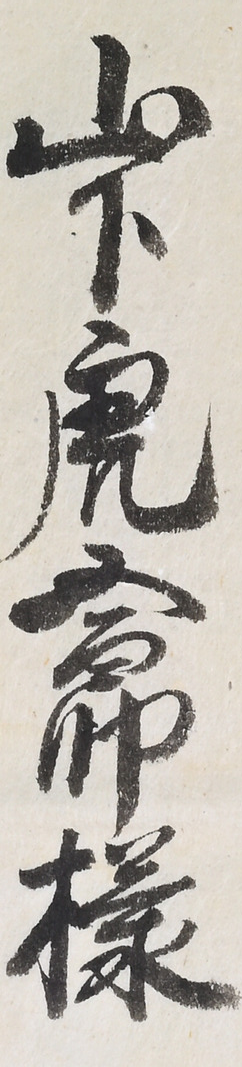山下虎五郎様
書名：弘化五戊申年正月他國出石切名前書上帳
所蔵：伊那市立高遠町図書館・合同会社AMANE
